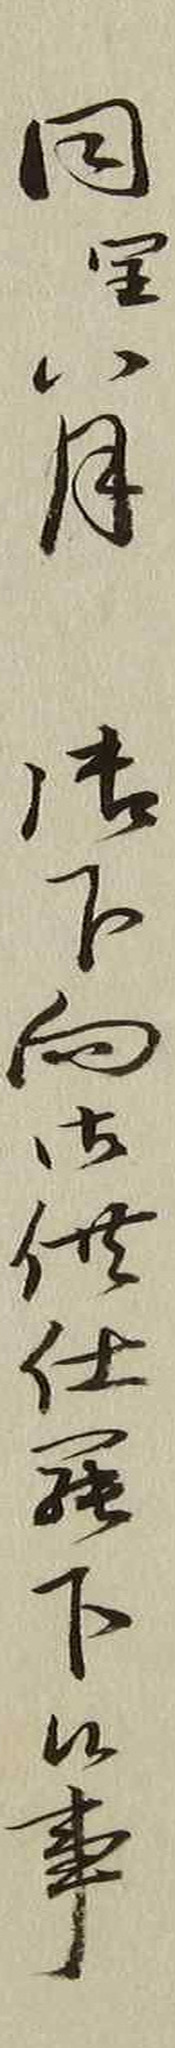同閏八月御下向御供仕罷下候事
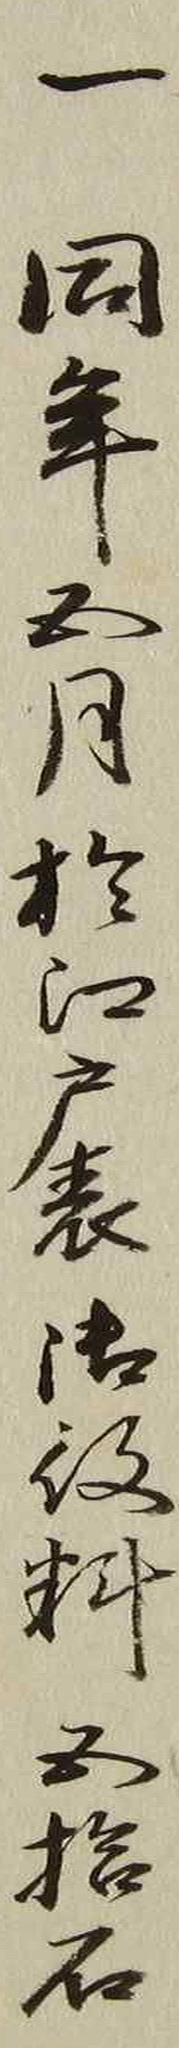一同年五月於江戸表御役料五拾石
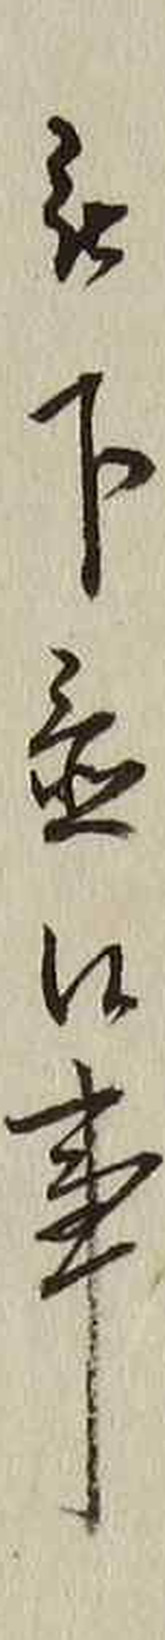被下置候事
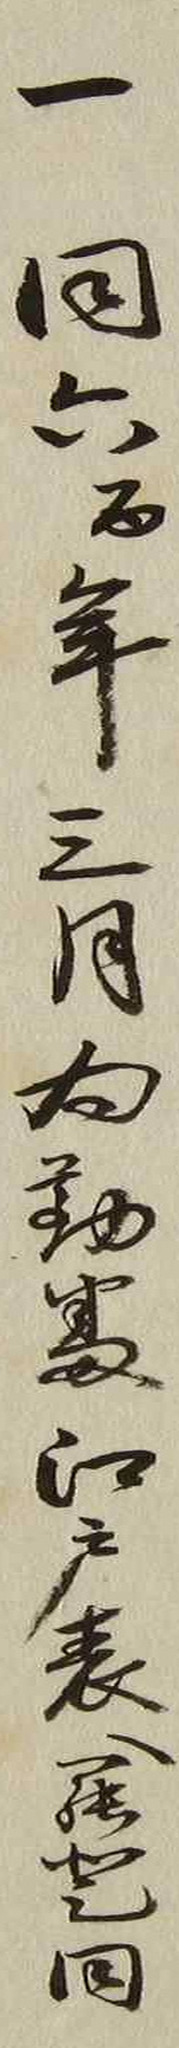一同六酉年三月為勤番江戸表へ罷登同
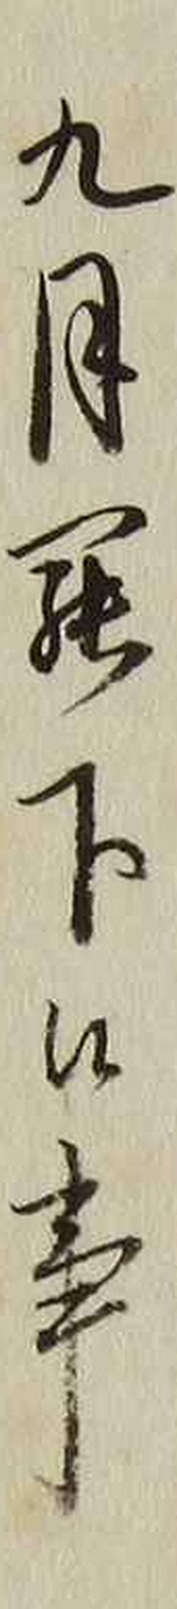九月罷下候事
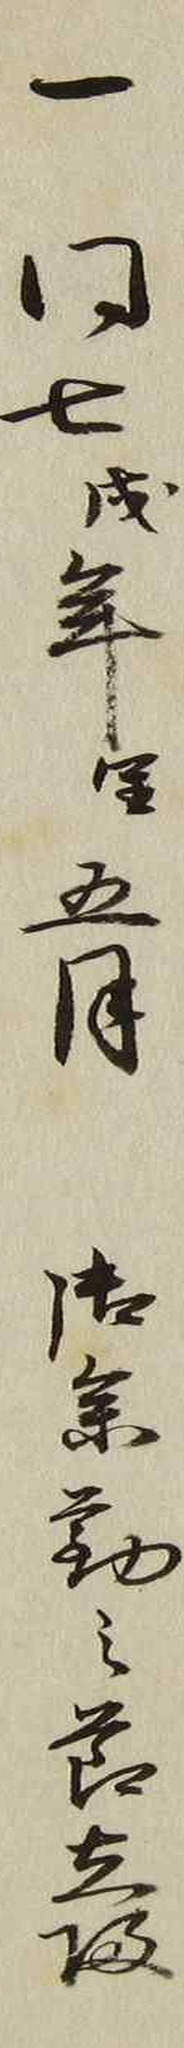一同七戌年閏五月御参勤之節立帰
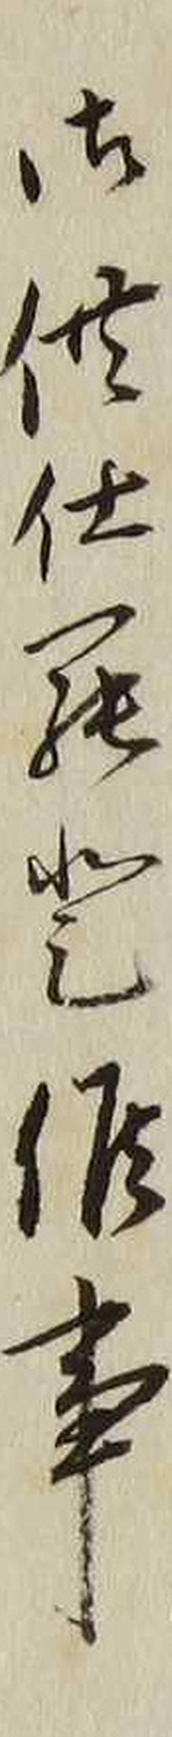御供仕罷登候事
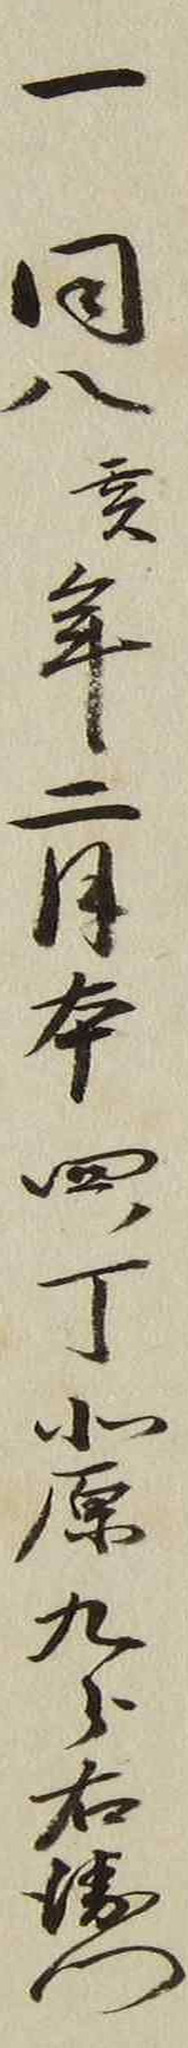一同八亥年二月本四ノ丁北原九郎右衛門
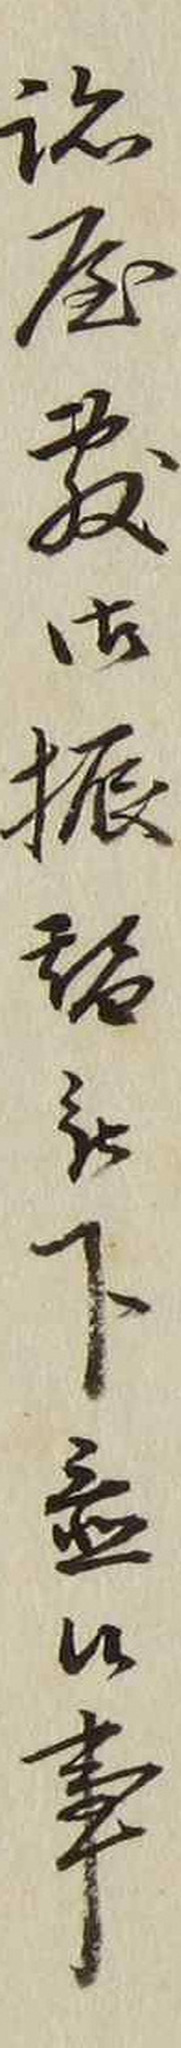跡屋敷御振替被下置候事
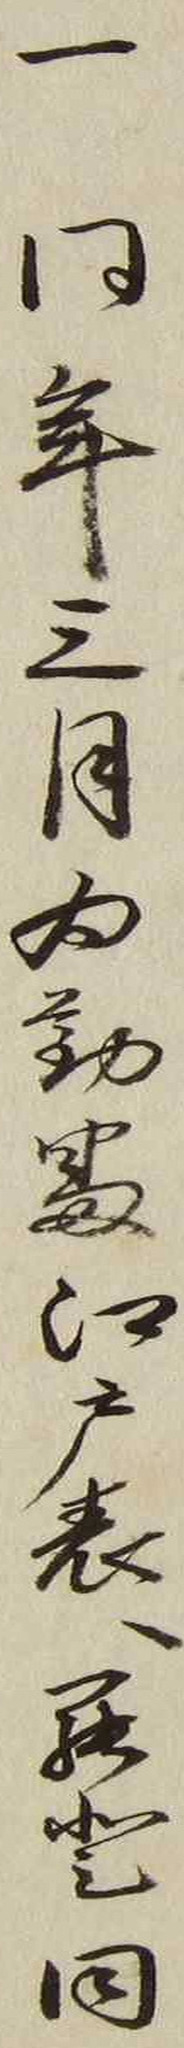一同年三月為勤番江戸表へ罷登同

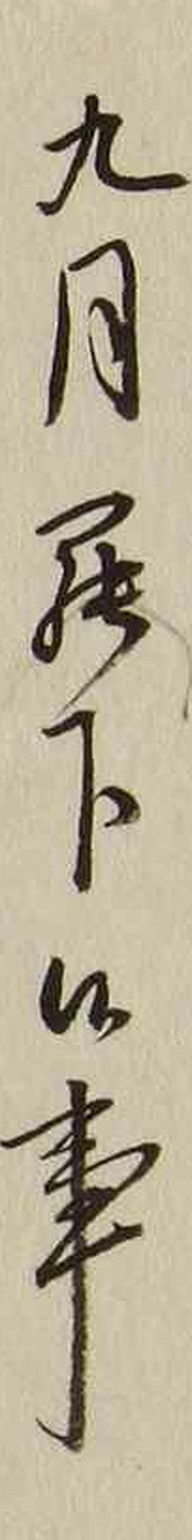九月罷下候事
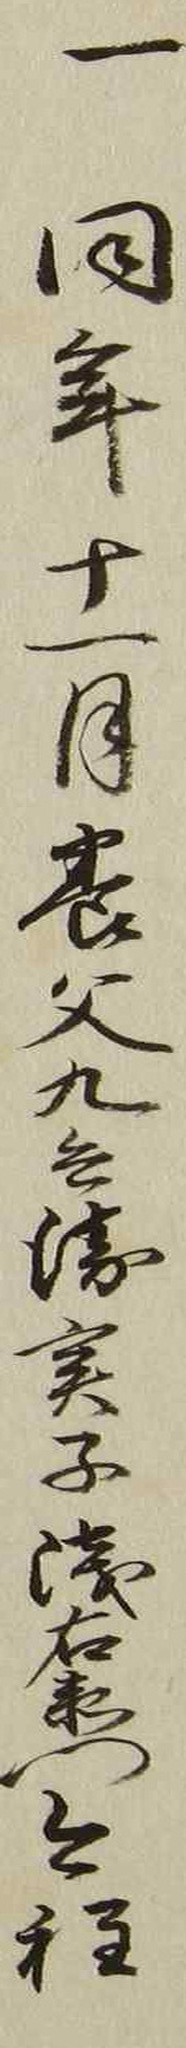一同年十一月養父九兵衛実子浅右衛門今程
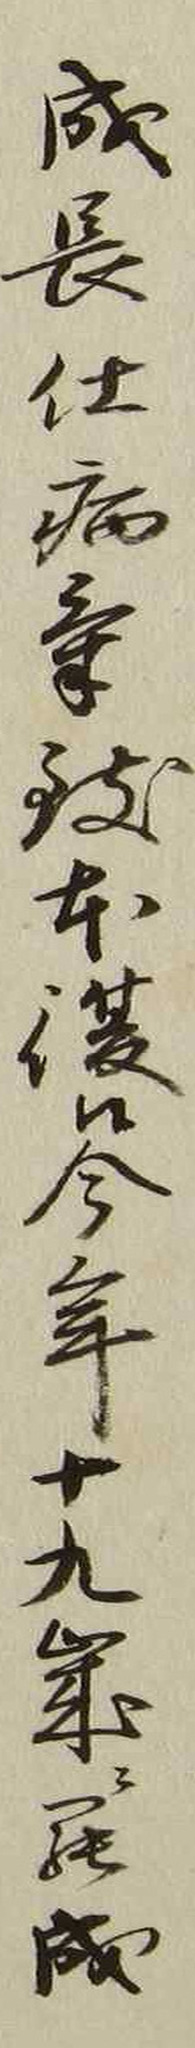成長仕病気致本復候今年十九歳ニ罷成
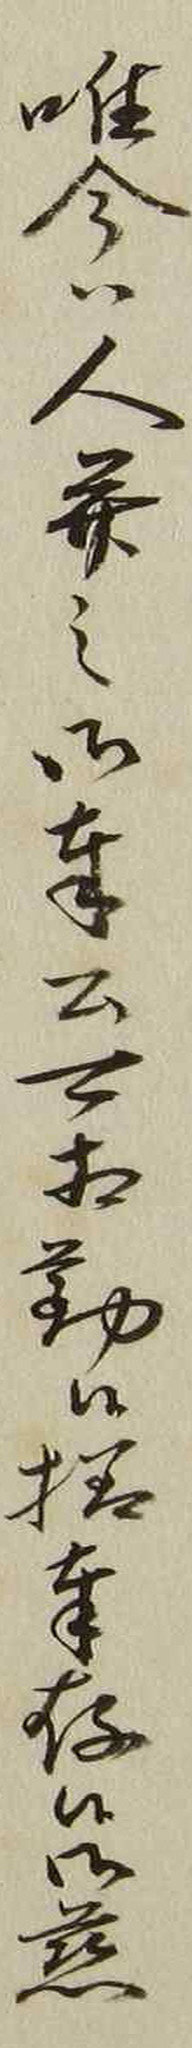唯今ハ人並之御奉公可相勤候様奉存候御慈
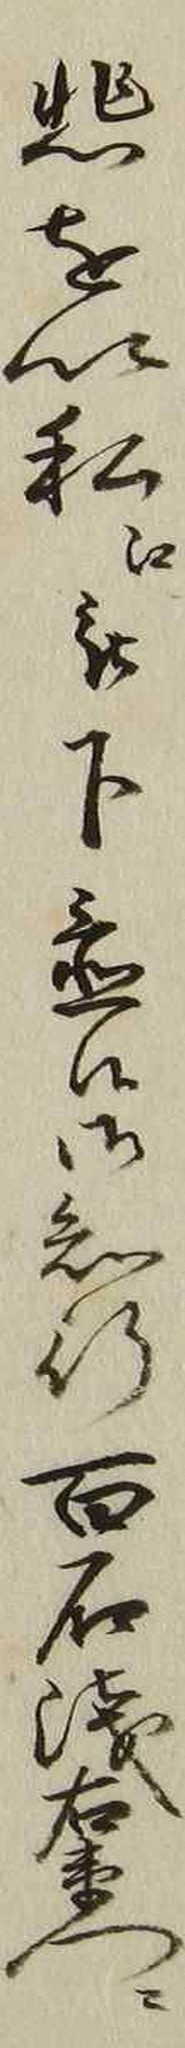悲を以私江被下置候御知行百石浅右衛門ニ
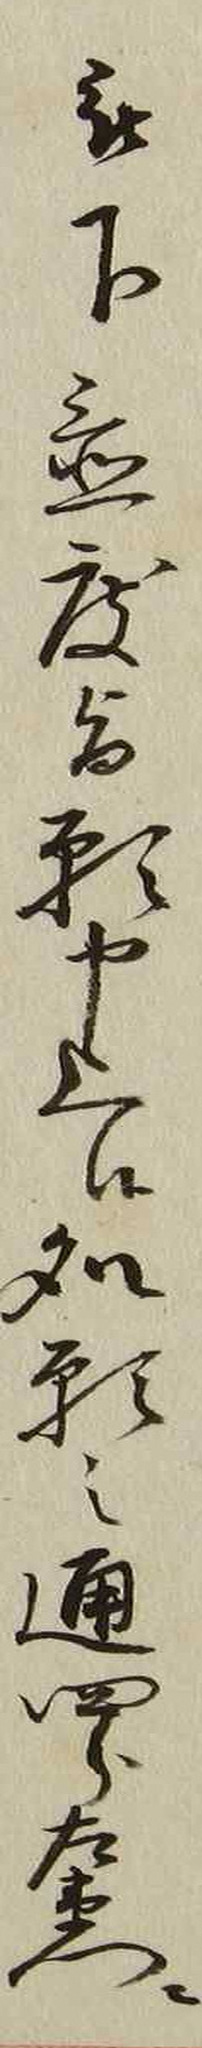被下置度旨願申上候処願之通四郎左衛門ニ
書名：諸士系譜　巻之149　そ之部2
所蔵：会津若松市立会津図書館
